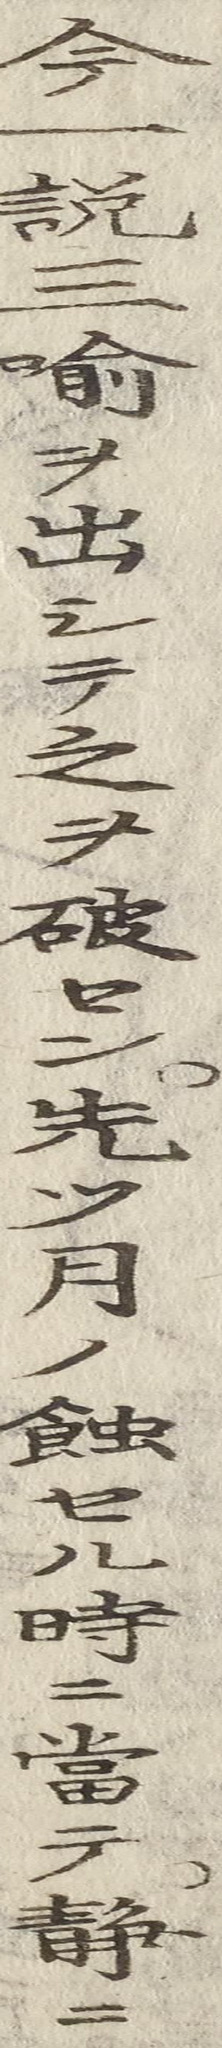今一説三喩ヲ出シテ之ヲ破セン。先ツ月ノ蝕セル時ニ当テ静ニ
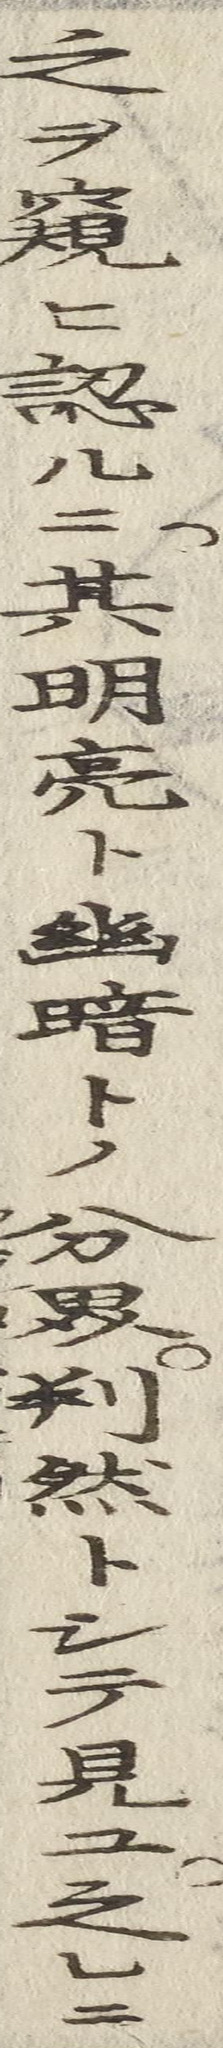之ヲ窺ヒ認ルニ。其明亮ト幽暗トノ分界。判然トシテ見ユ。之レニ
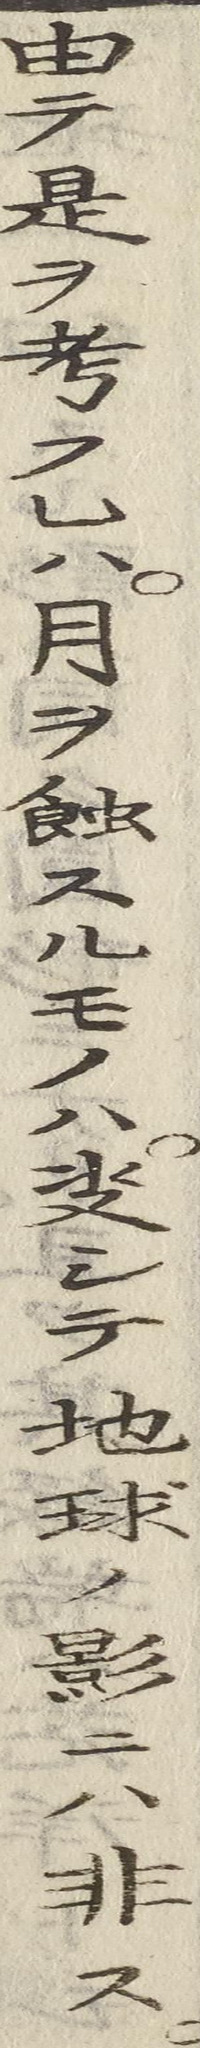由テ是ヲ考フレハ。月ヲ蝕スルモノハ。果シテ地球ノ影ニハ非ス。
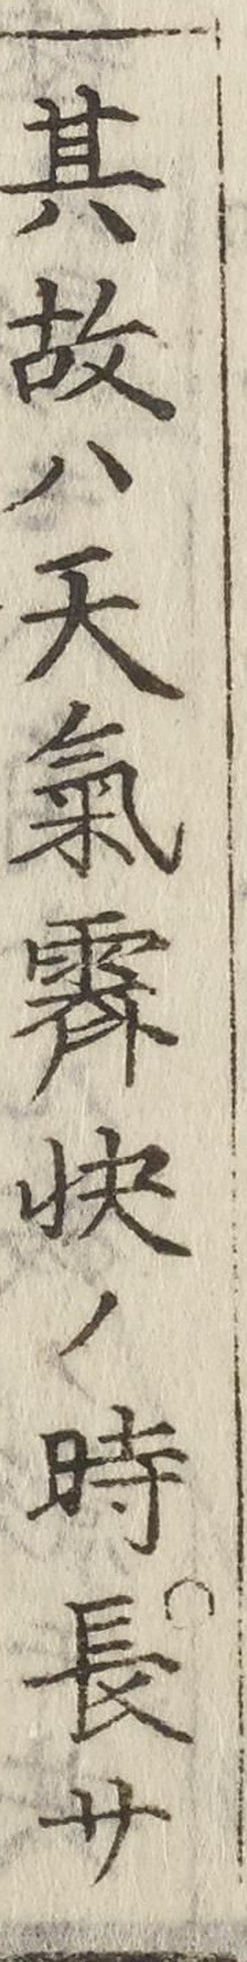其故ハ天気霽快ノ時。長サ
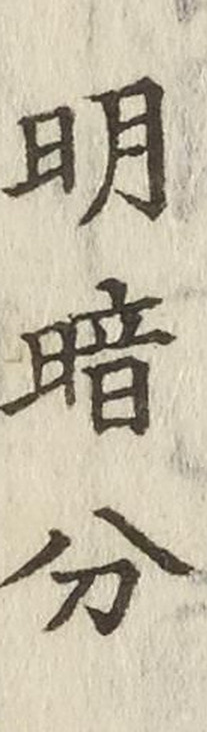明暗分
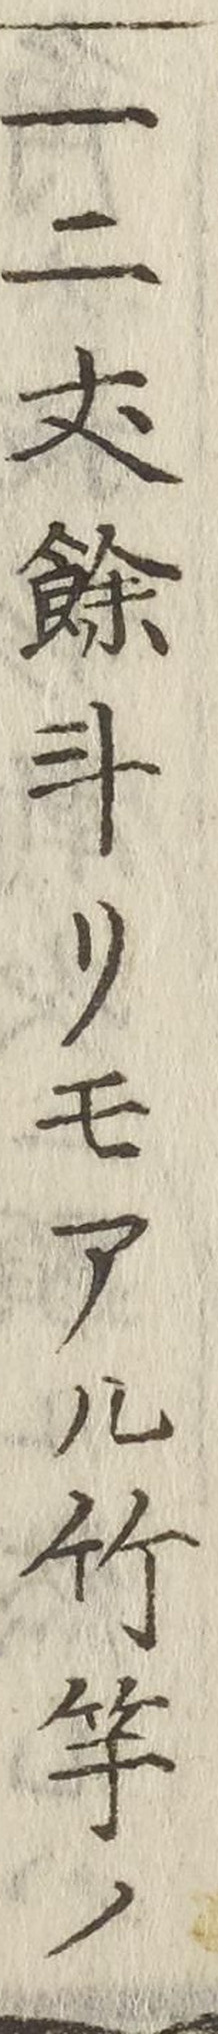一二丈余斗リモアル竹竿ノ
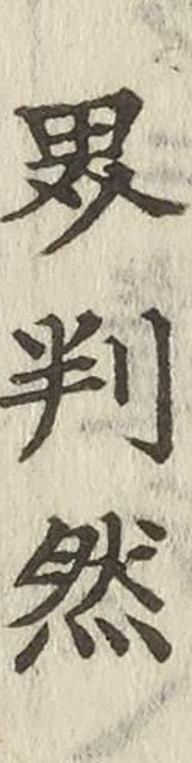界判然
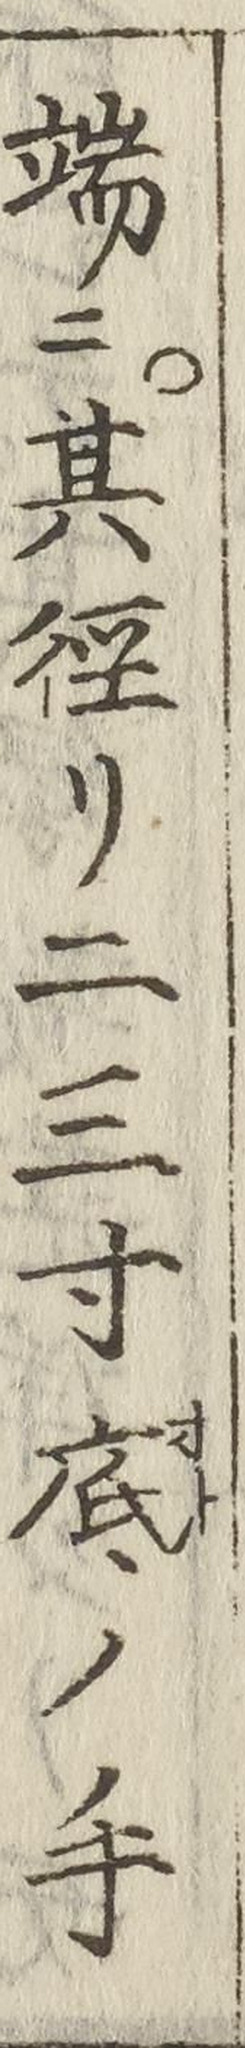端ニ。其径リ二三寸底ノ手
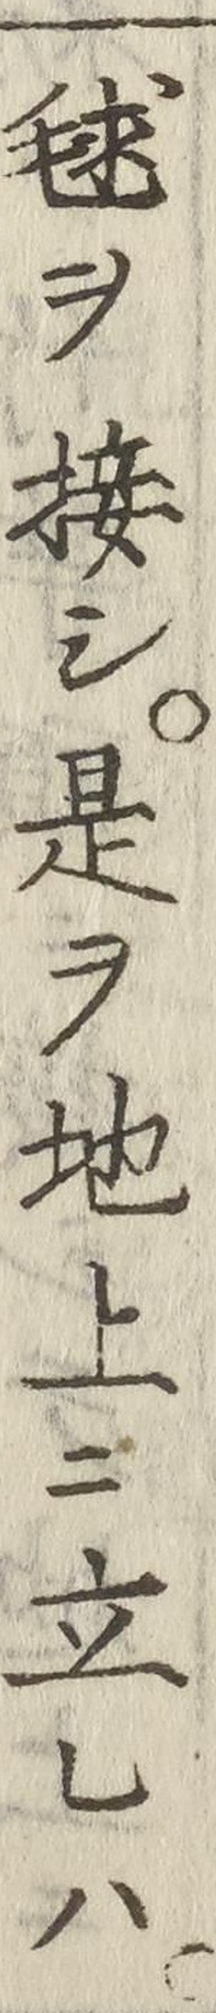毬ヲ接シ。是ヲ地上ニ立レハ。
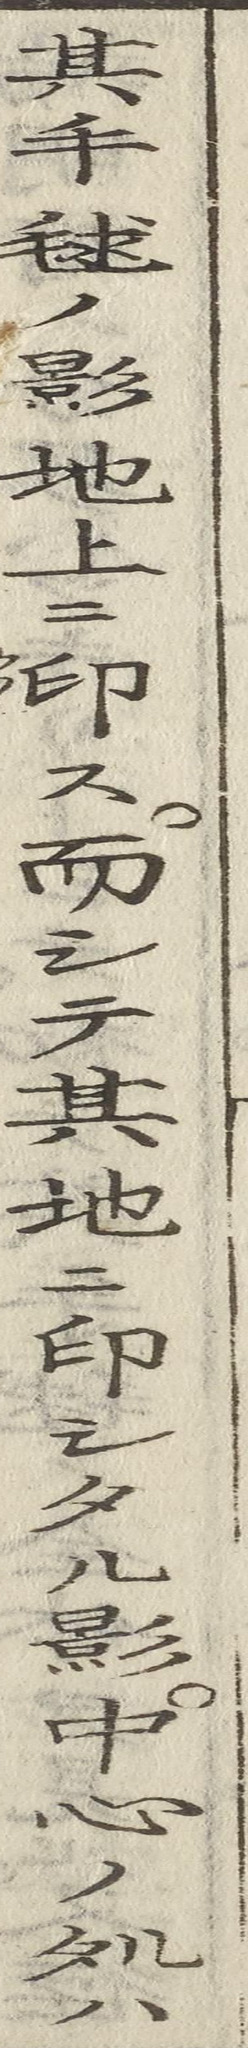其手毬ノ影地上ニ印ス。而シテ其地ニ印シタル影。中心ノ処ハ
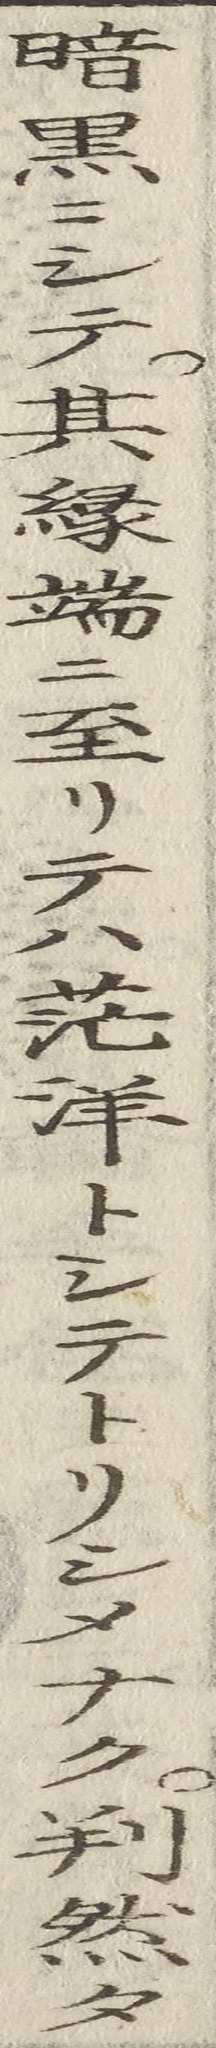暗黒ニシテ。其縁端ニ至リテハ茫洋トシテトリシメナク。判然タ
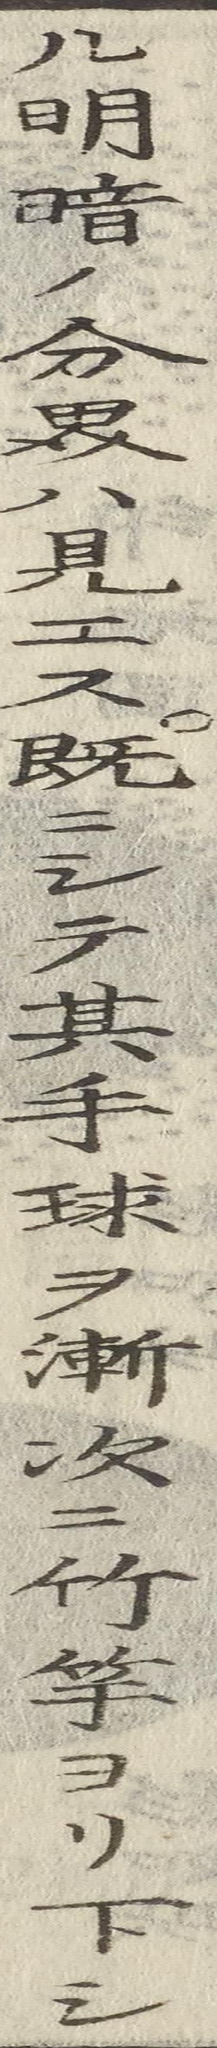ル明暗ノ分界ハ見エス。既ニシテ其手毬ヲ漸次ニ竹竿ヨリ下シ
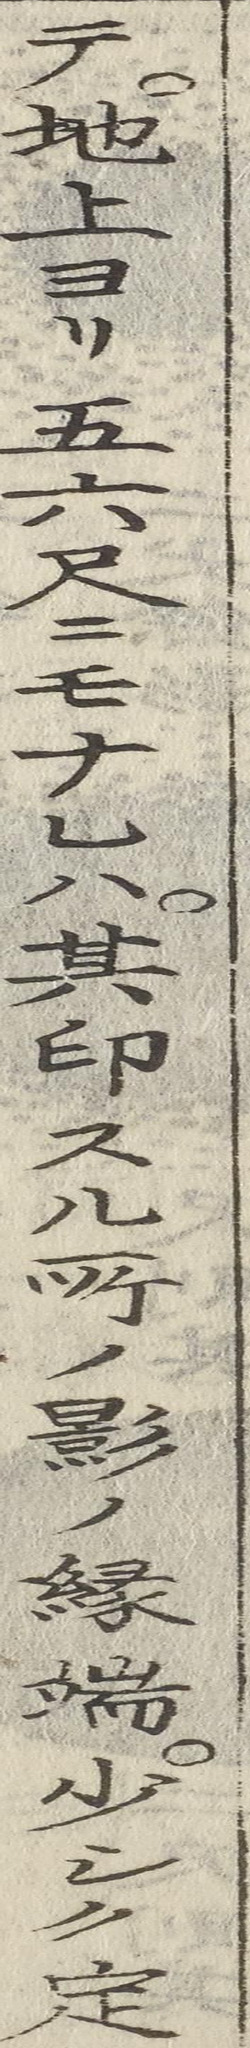テ。地上ヨリ五六尺ニモナレハ。其印スル所ノ影ノ縁端。少シク定
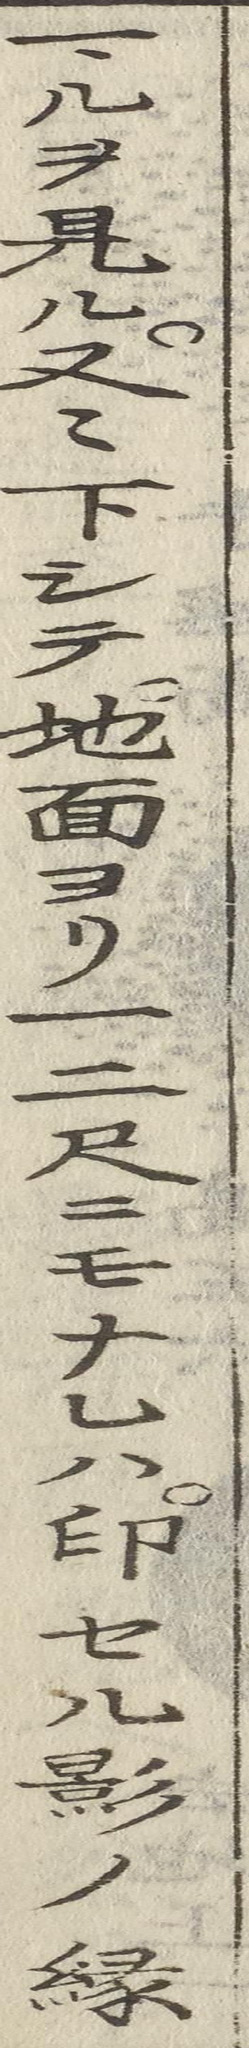マルヲ見ル。又々下シテ。地面ヨリ一二尺ニモナレハ。印セル影ノ縁

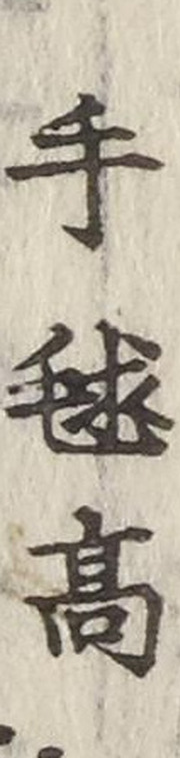手毬高
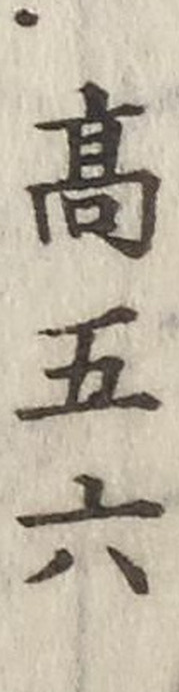高五六
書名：護法新論　中
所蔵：東京大学地震研究所図書室 Earthquake Research Institute Library, The University of Tokyo, JAPAN
